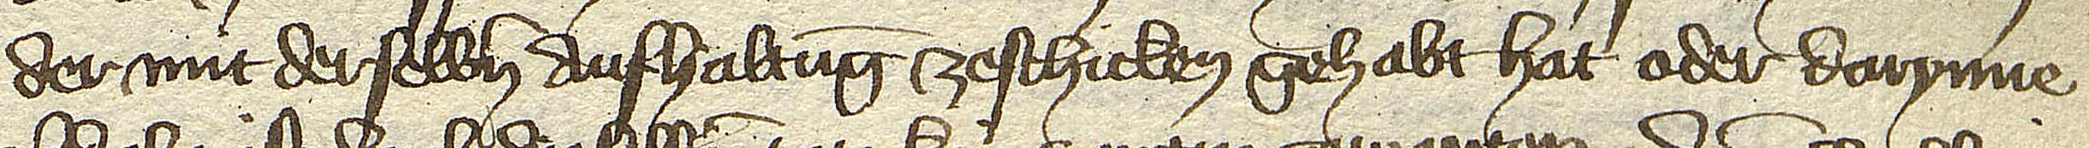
der mit derſelbn* Aufhaltug* cʒeſchicken gehabt hat oder darynne
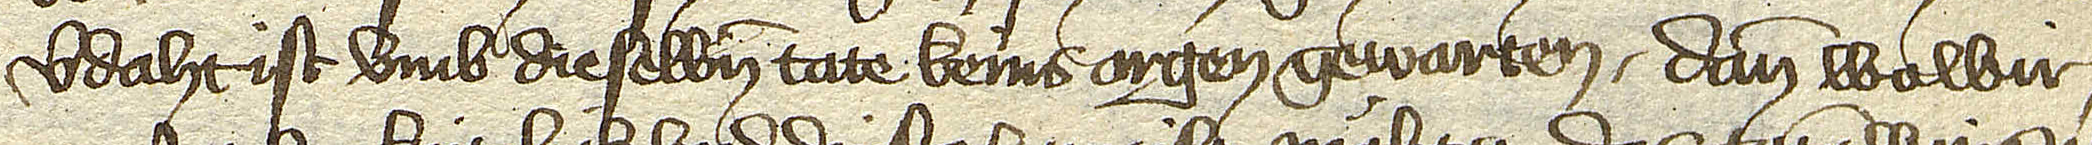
v*daht iſt vmb dieſelbn* tate keins argen gewarten / dan* wo wir
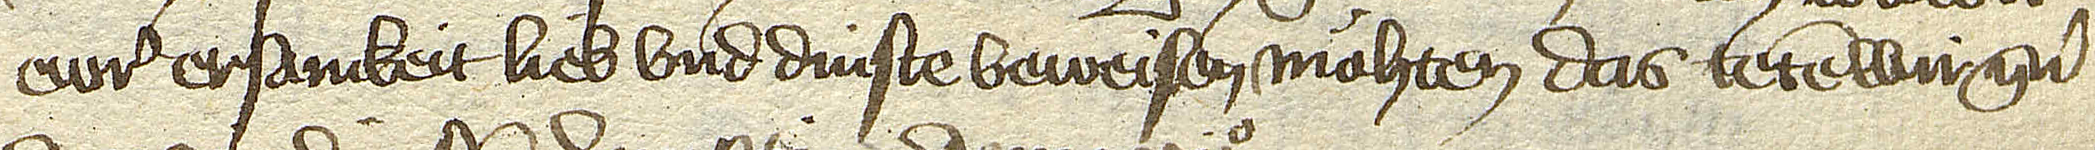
ewr* erſamkeit lieb vnd dinſte beweiſen möhten das tete* wir gn*
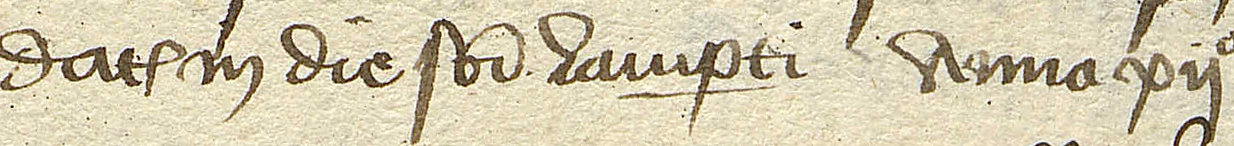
dat* in die ſci* lamp*ti Anno xii*
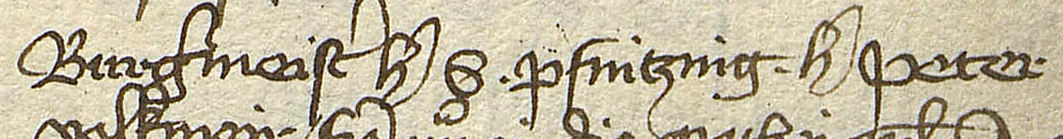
Burg*meiſt* h* S . pfintʒing . h* Peter
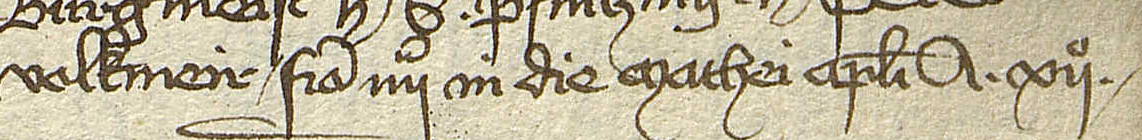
volkmeir fia* iiii* in die Mathei apli* A . xii* . /
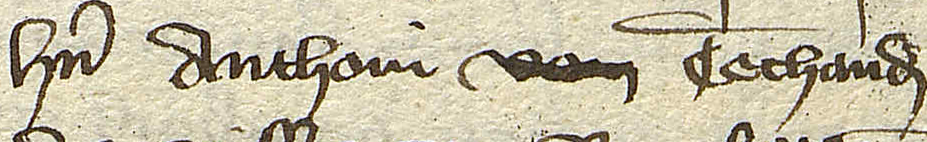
hn* Anthoni von Techand*
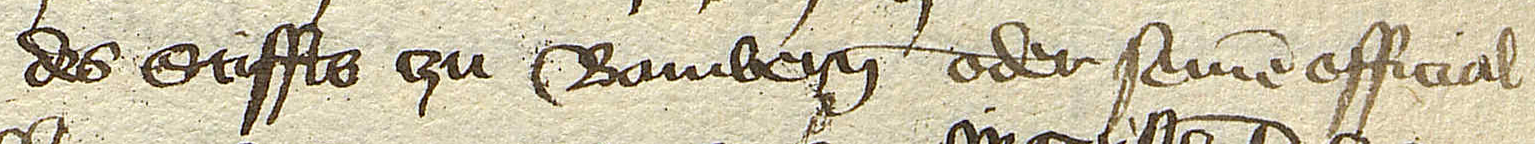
des Stiffts cʒu Bamberg oder ſeine* official
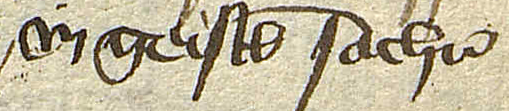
in geiſtl* ſachn*
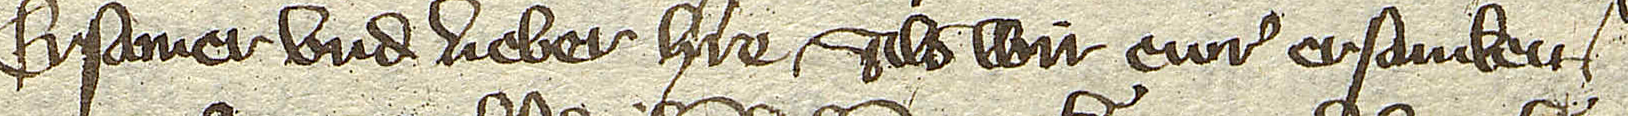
Erſamer vnd lieber h*re / Als wir ewr* erſamkeit /
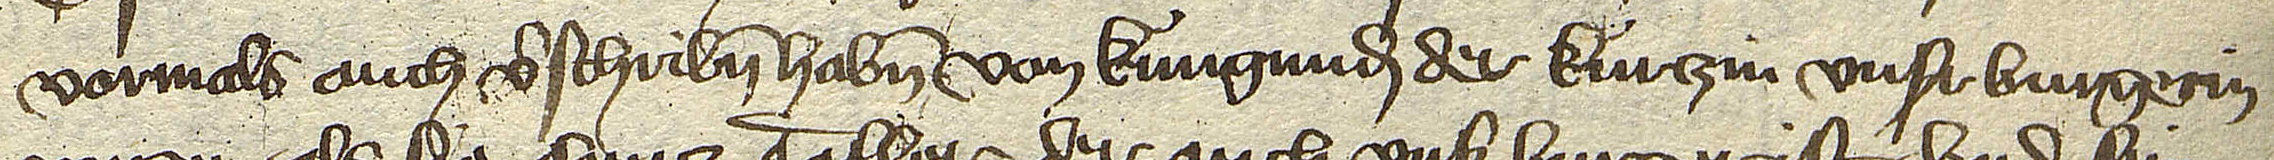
vormals auch v*ſchribn* habn* von küngund* der kürcʒin vnſ*r burgerin
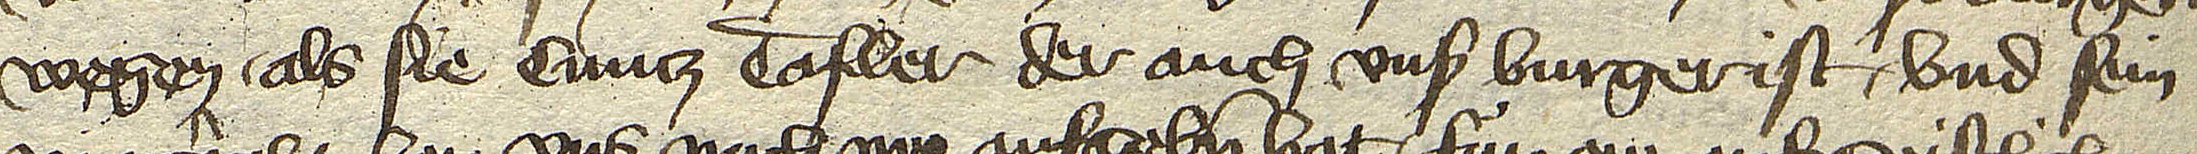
wegen / als ſie Cuncʒ Tofler der auch vnſ* burger iſt / vnd ſein
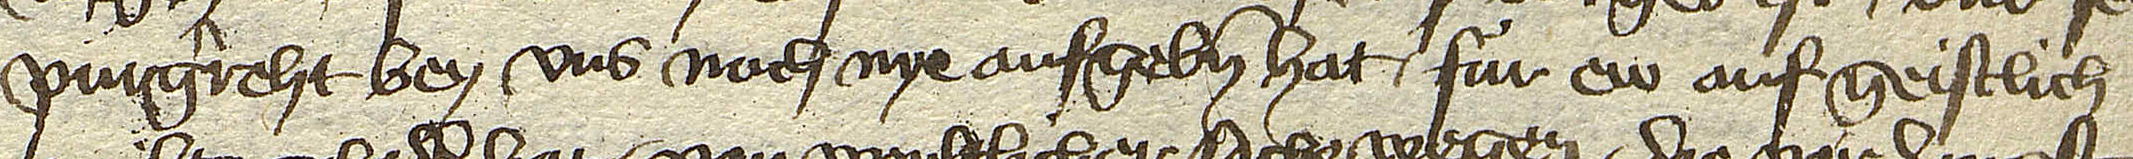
purgreht bey vns noch nye aufgebn* hat / für ew auf geiſtlich
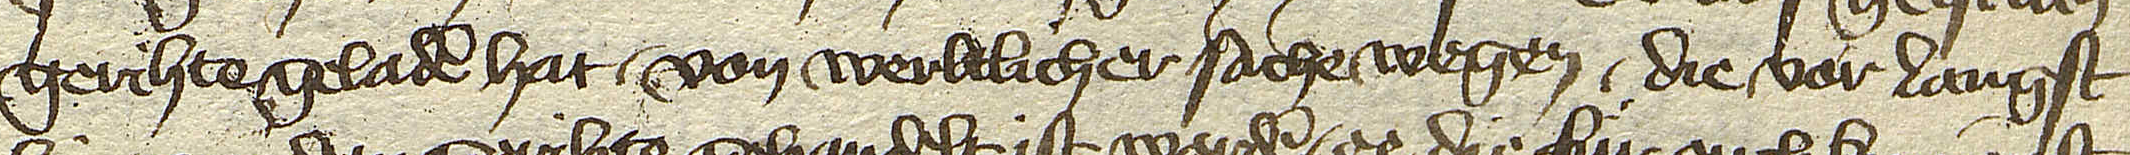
gerihte gelade* hat / von werltlicher ſache wegen / die vor langſt
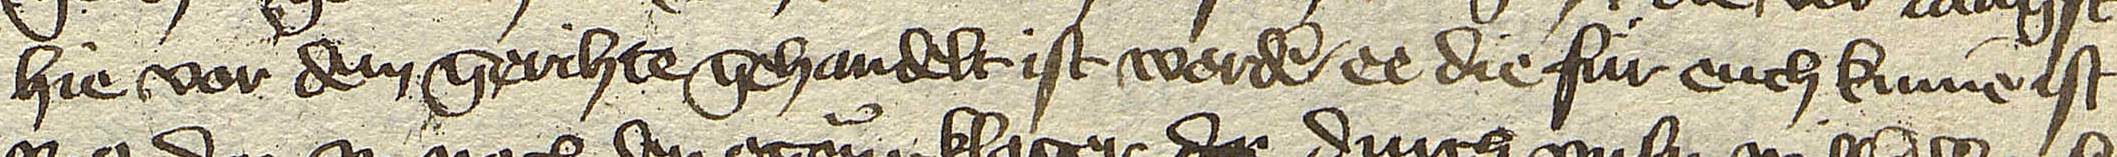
hie vor dem gerichte gehandelt iſt werde / ee die für euch kume iſt
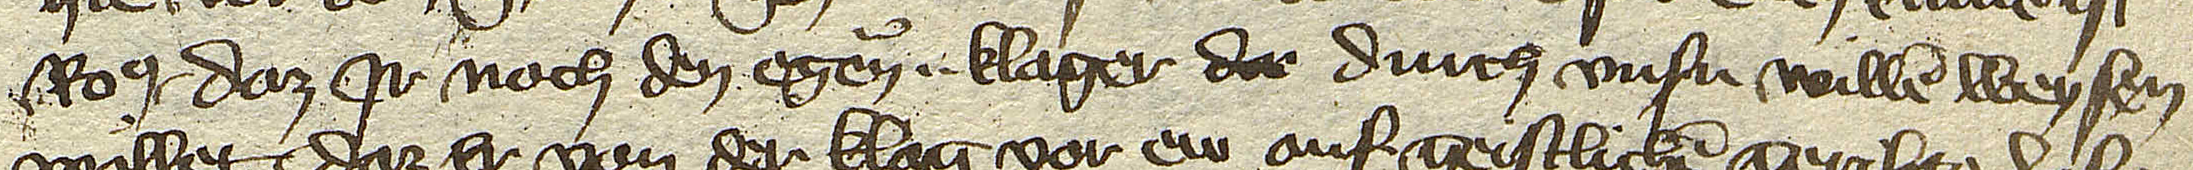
Ro* / daʒ Ir noch den egen* ~ klager da durch vnſ*n wille* weyſen
